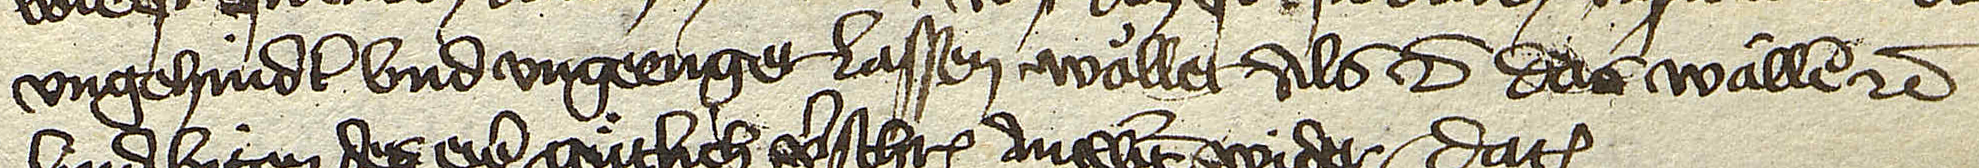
vngehindt* vnd vngeenget laſſen wöllet / Als ec* das wölle* ec*
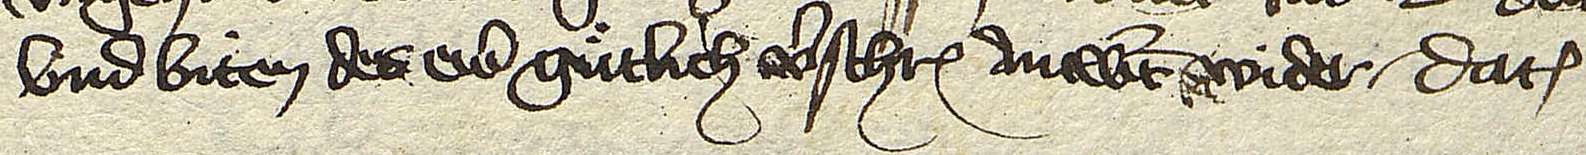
vnd biten des ew* gütlich v*ſchr* antw*t wider / dat*
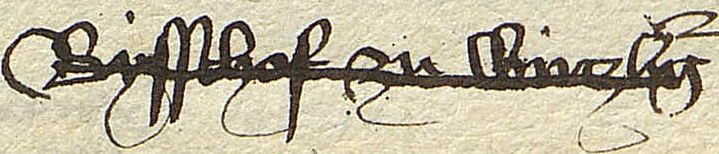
Byſſchof cʒu Wircʒb*g
